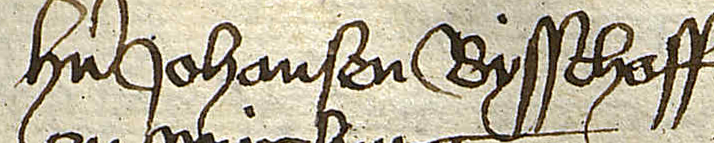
hn* Iohanſen Byſſchoff
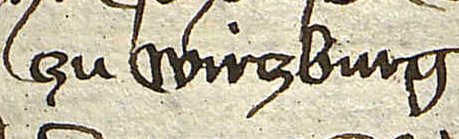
cʒu wircʒburg
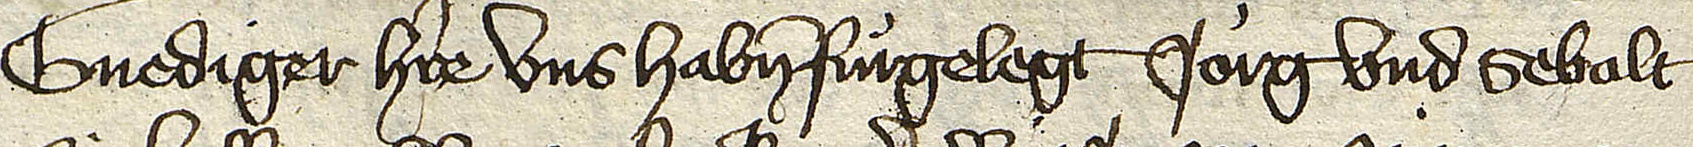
Gnediger h*re Vns habn* fürgelegt Iörg vnd Sebolt
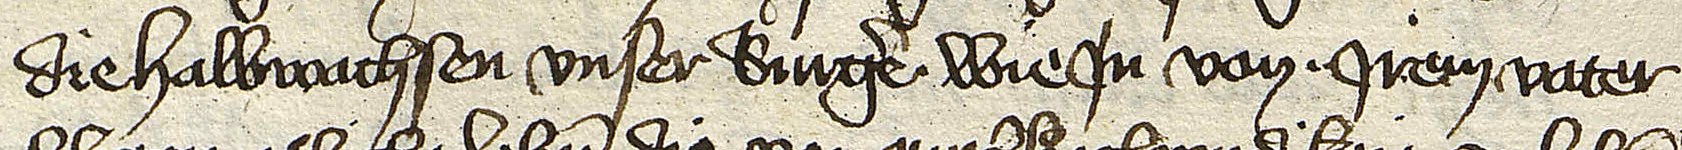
die halbwachſen vnſer Burge* . wie In von ~ Irem vater
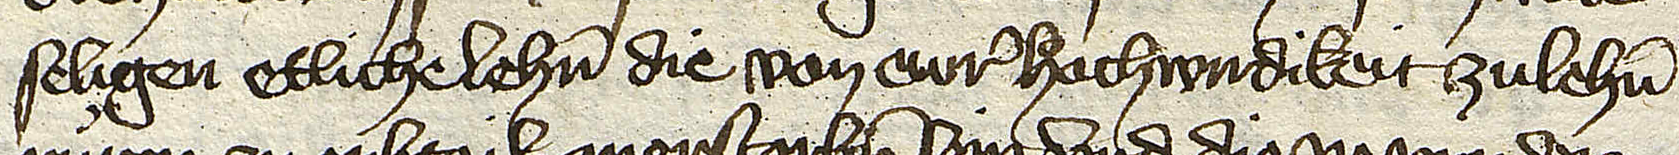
ſeligen etliche lehn* die von ewr* hochwirdikeit cʒulehn*
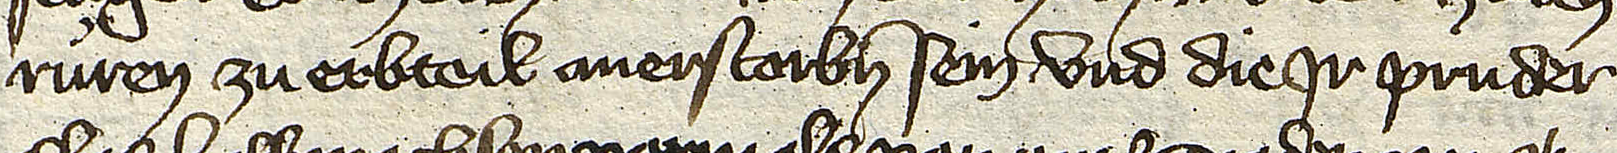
rüren cʒu erbteil anerſtorbn* ſein / vnd die Ir pruder
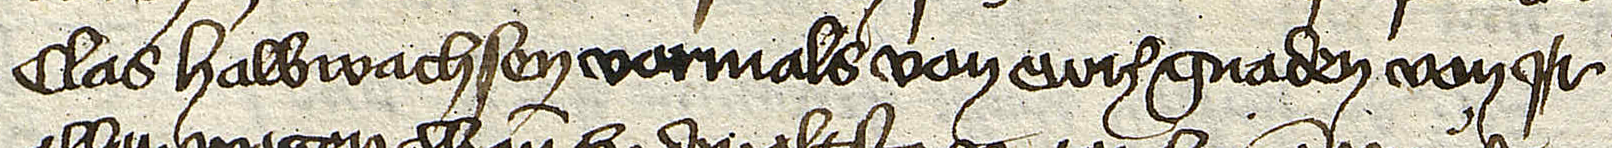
Clas halbwachſen vormals von ewn* gnaden von Ir
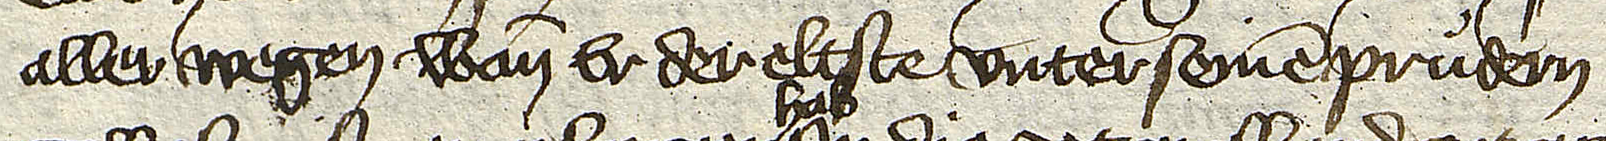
aller wegen / wan* Er der eltſte vnter ſeine* prüdern
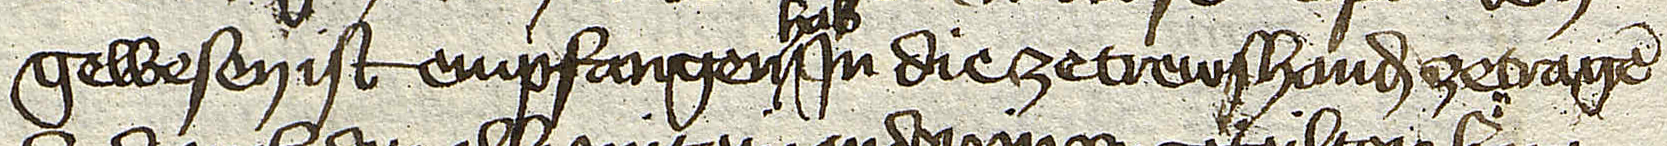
geweſen iſt empfangen In die cʒetrewſhand* cʒetrage*
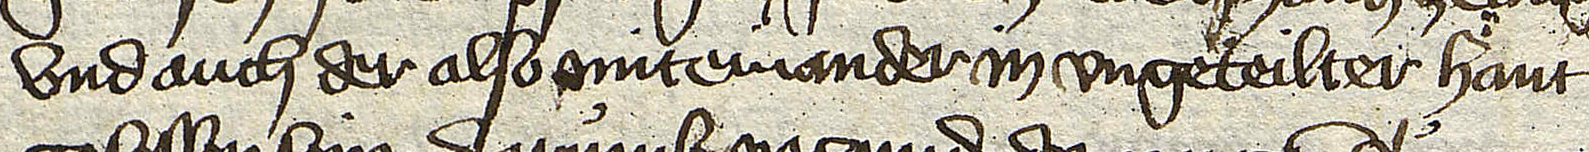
vnd auch der alſo miteinander in vngeteilter hant
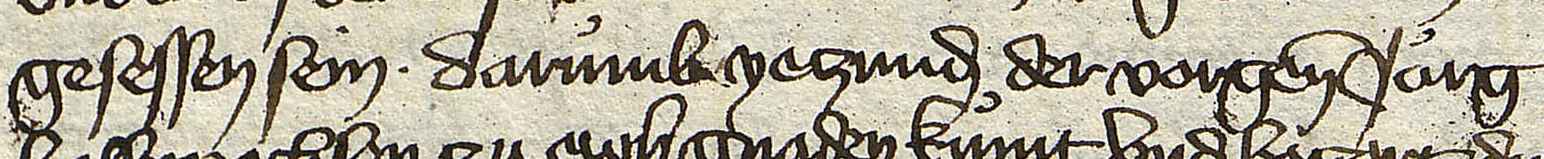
geſeſſen ſein . darümb yecʒund* der vorgen* Iörg
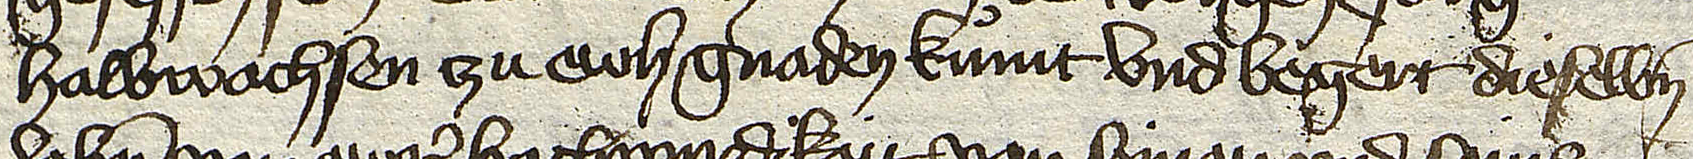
halbwachſen cʒu ew*n gnaden kümt vnd begert dieſelbn*
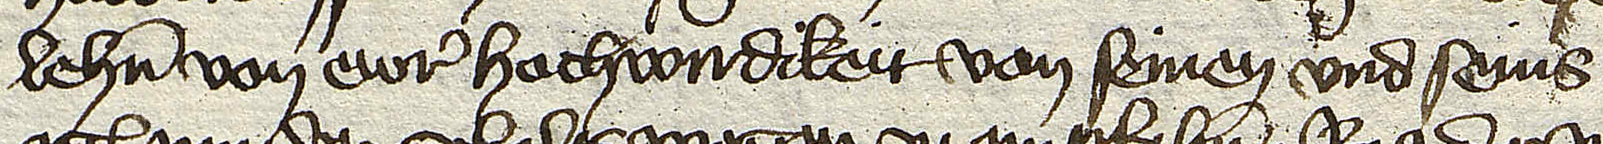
lehn* von ewr* hochwirdikeit von ſeinen vnd ſeins
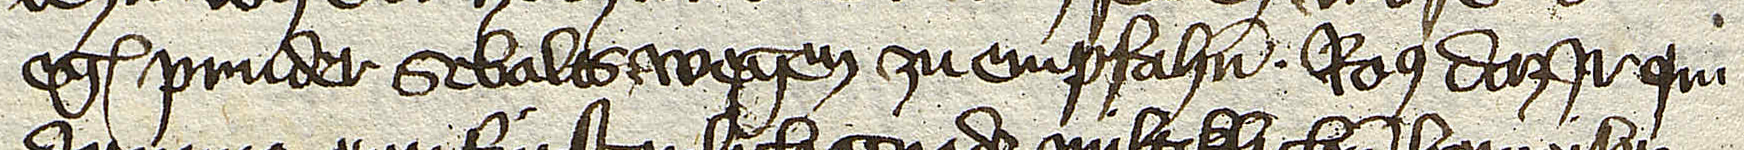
eg* pruder Sebolts wegen cʒu empfahn* . Ro* daʒ Ir Im
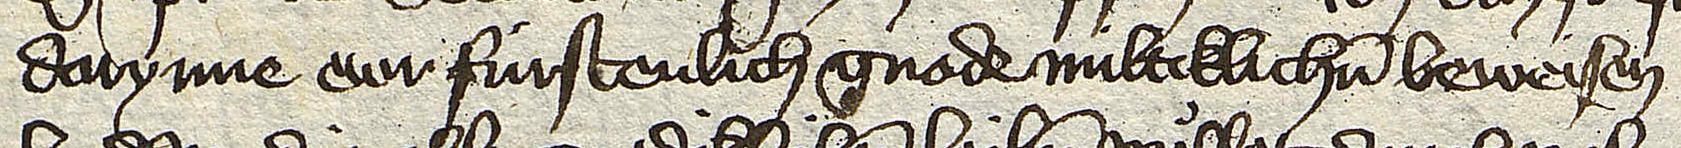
darynne ewr fürſtenlich gnade miltiklichn* beweiſen
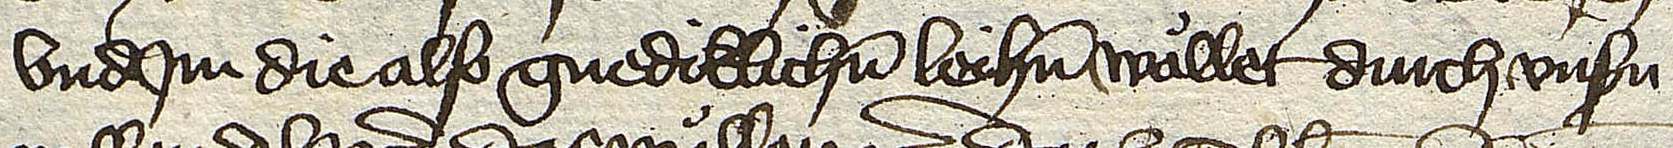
vnd Im die alſo gnediklichn* leihn* wöllet durch vnſ*n
